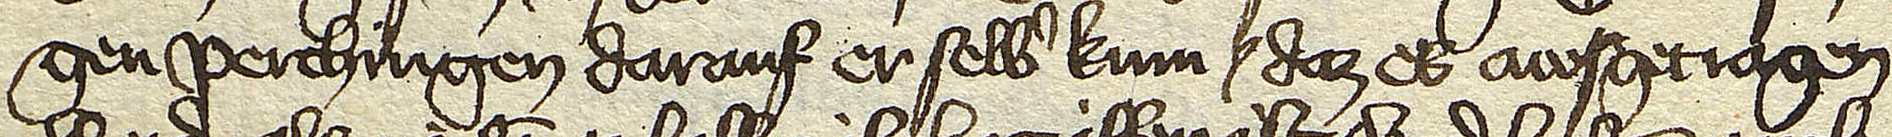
gen Perchingen darauf er ſelb* kum / daʒ es awſgetragen
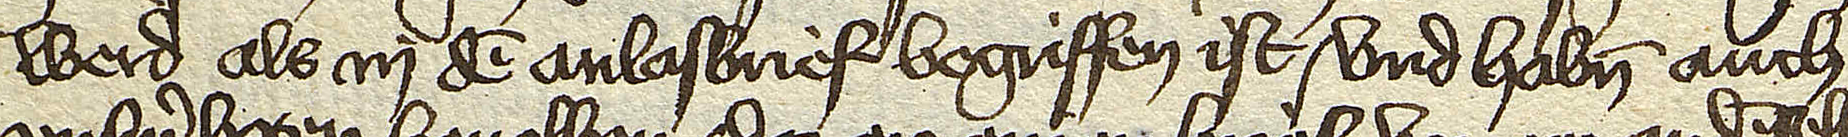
werd als in de* anlaſbrief begriffen iſt / vnd habn* auch
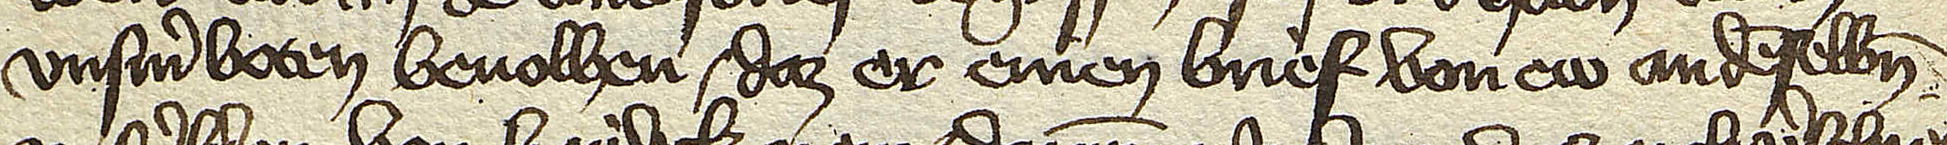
vnſm* boten beuolhen / daʒ er einen brief von ew an de*ſelbn*
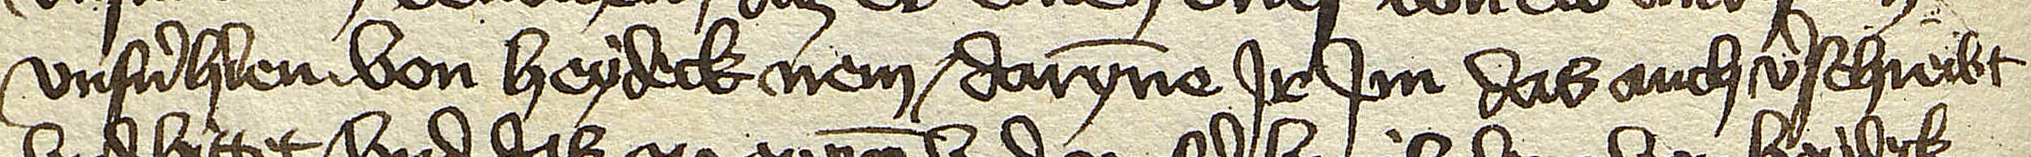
vnſn* hr*en von heydeck nem / daryne* Ir Im das auch v*ſchreibt
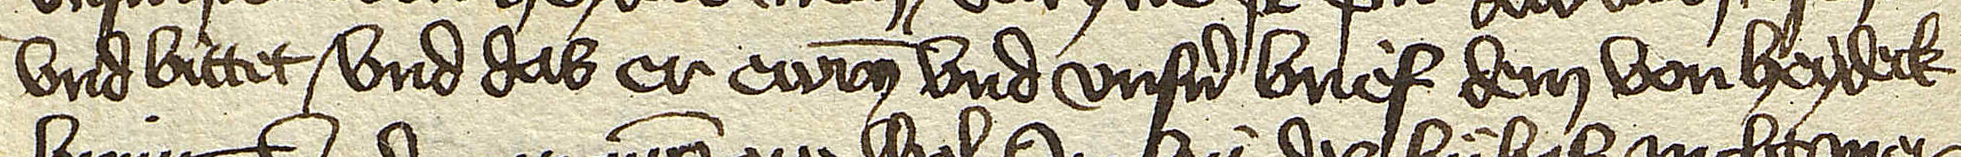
vnd bittet / vnd das er ewrn* vnd vnſn* brief dem von heydeck
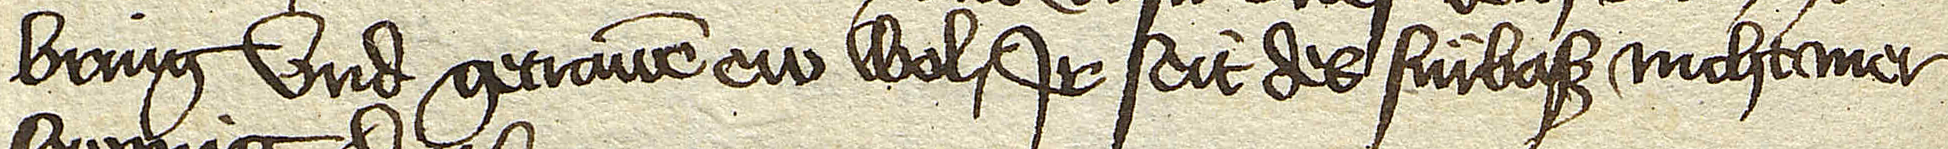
bring vnd getrawe* ew wol Ir ſeit des fürbaſʒ nicht mer
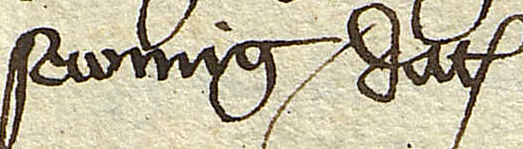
ſewmig / dat*
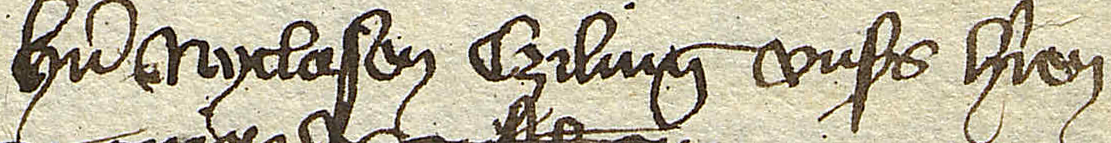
hn* Nyclaſen Cʒiling vnſ*s h*ren
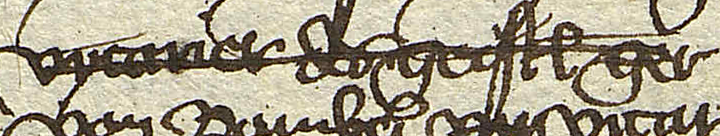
vycarier des geiſtl ger
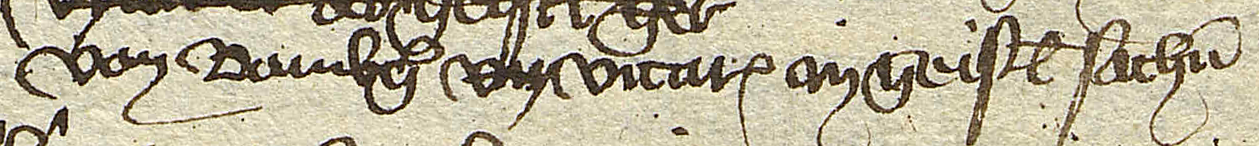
von Bambg* vy vicar* in geiſtl* ſachn*
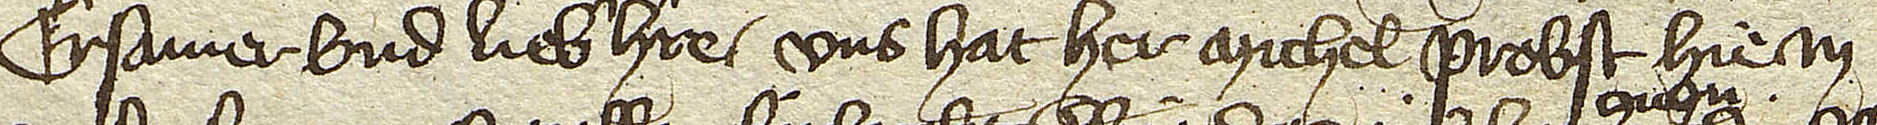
Erſamer vnd lieb* h*re / vns hat her Michel Probſt hie in
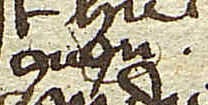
cʒu In
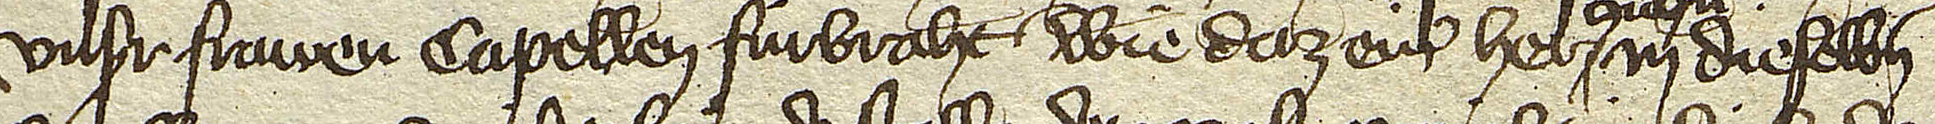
vnſ*r frawen Capellen fürbraht / wie daʒ ein* her in dieſelbn*
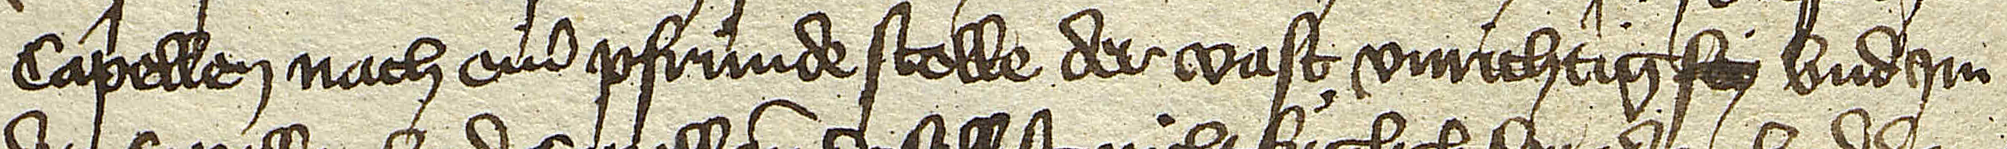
Capellen nach ein* pfründe ſtelle der vaſt vnrichtig ſey vnd Im
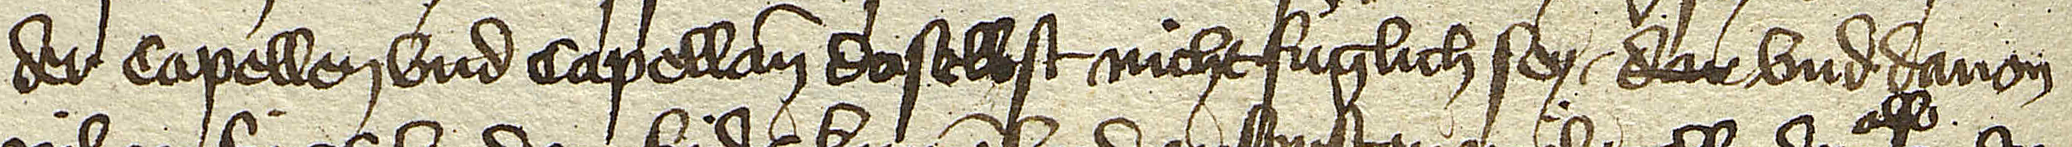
der Capellen vnd Capellan* doſelbſt nicht füglich ſey / dar vnd dauon
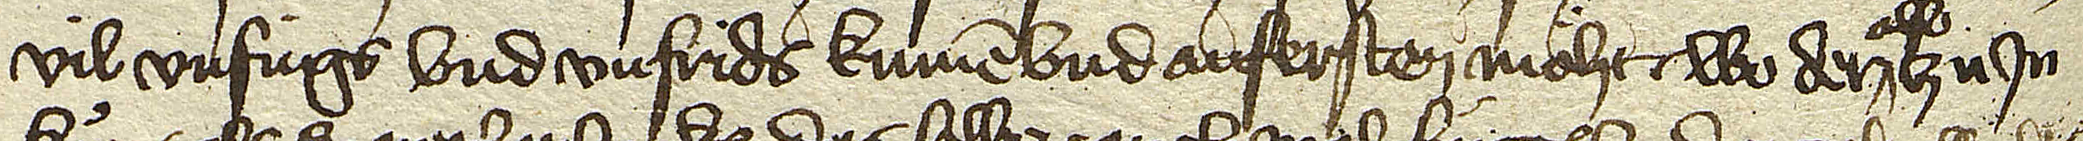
vil vnfugs vnd vnfrids kume* vnd auſerſten möht / wo der cʒu In
